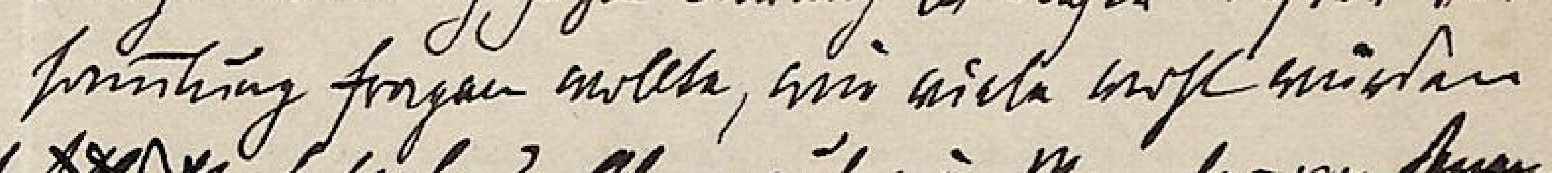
sammlung fragen wollte, wie viele wohl würden
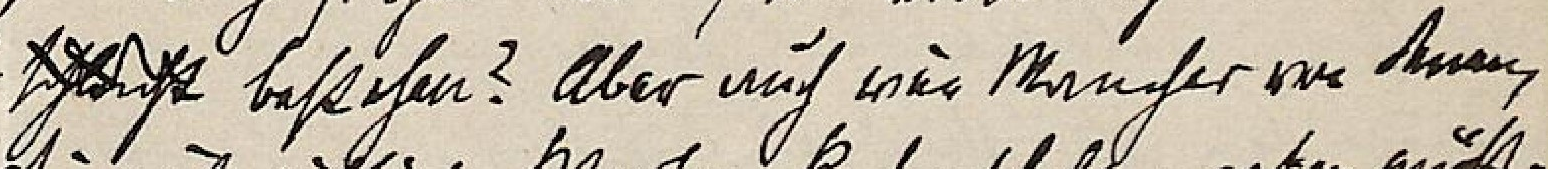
schlecht bestehen? Aber auch wie Mancher von denen,
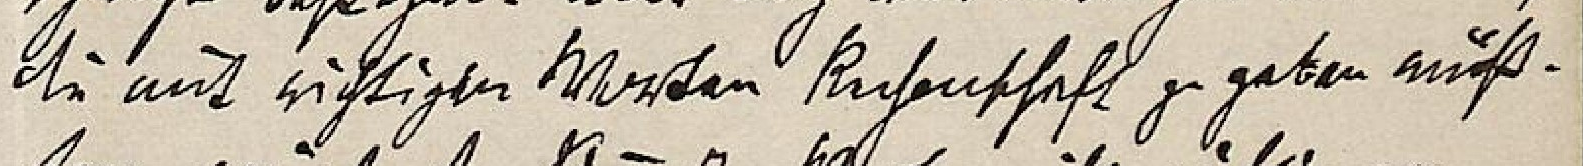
die mit richtigen Worten Rechenschaft z. geben wüß¬
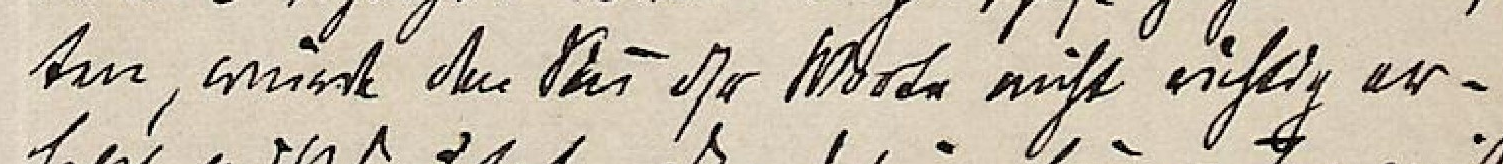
ten, würde den Sin der Worte nicht richtig er¬
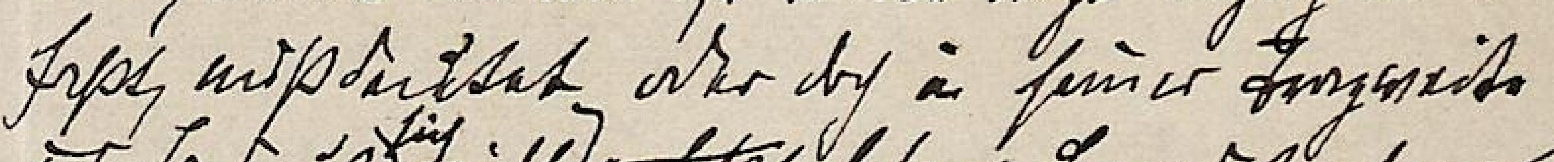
faßt, mißdeutet oder doch in seiner Tragweite
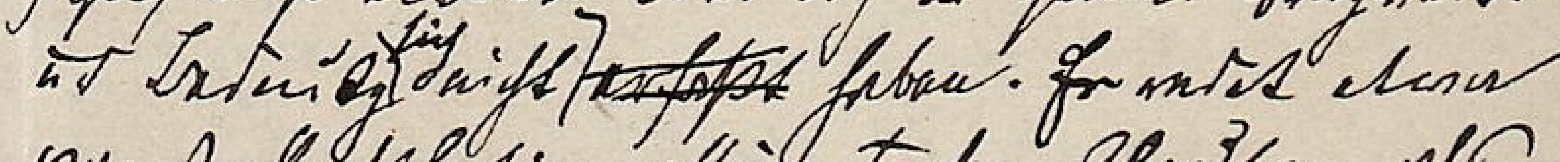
und Bedeutg sich micht erfaßt haben. Er redet etwa
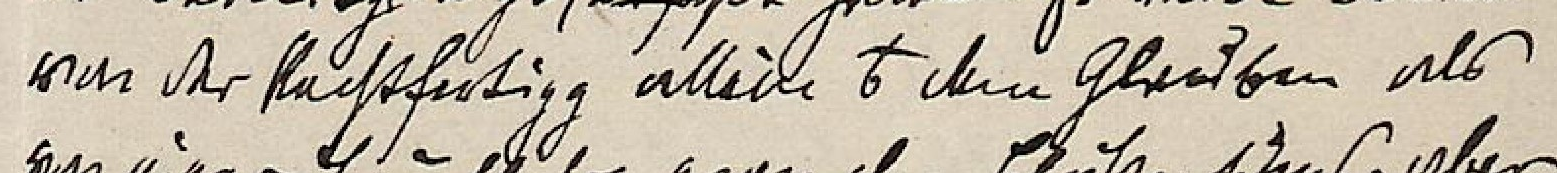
von der Rechtfertigung allein s dem Glauben als
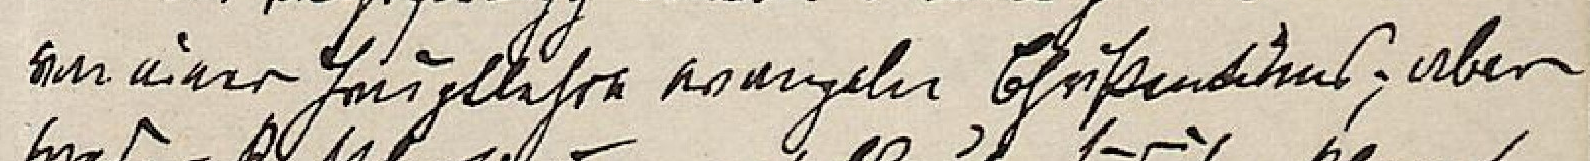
von einer Hauptlehre evangeln Christentums; aber
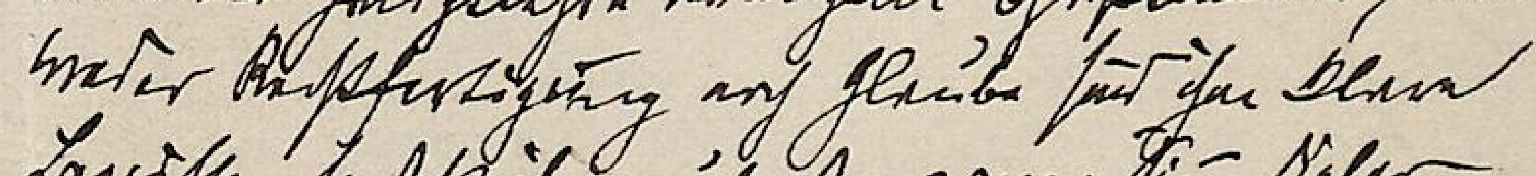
weder Rechtfertigung noch Glaube sind ihm klare
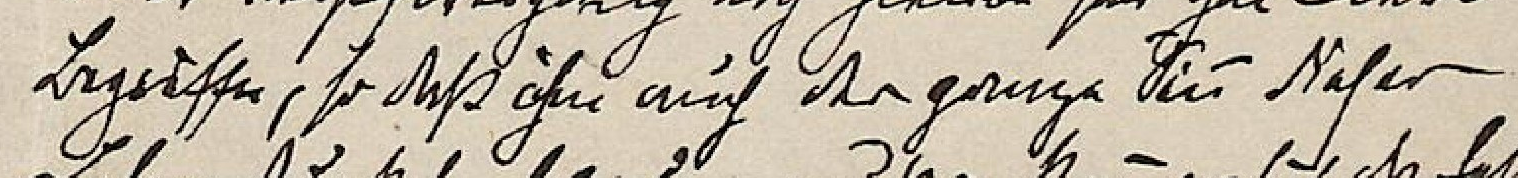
Begriffe, so daß ihm auch der ganze Sin dieser
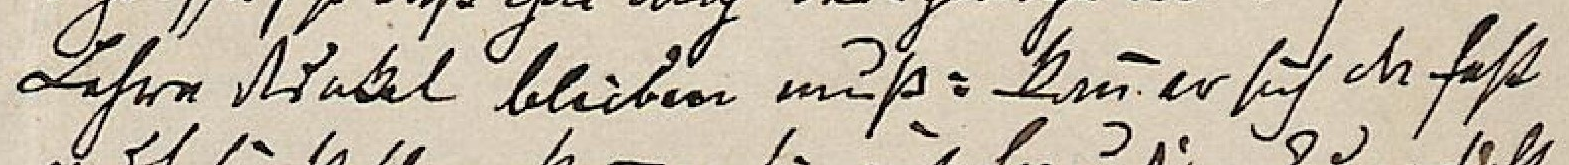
Lehre dunkel bleiben muss : kan er sich da fest
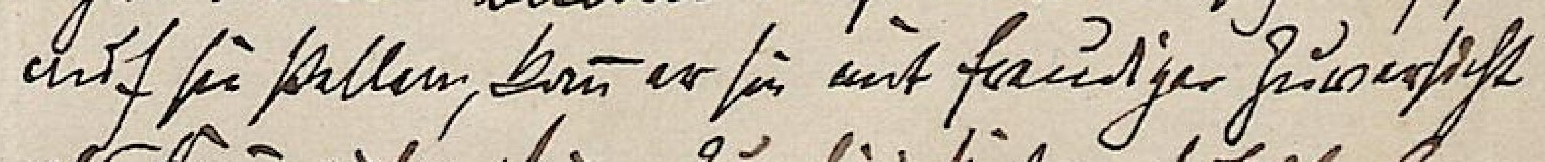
auf sie stellen, kan er sie mit freudiger Zuversicht
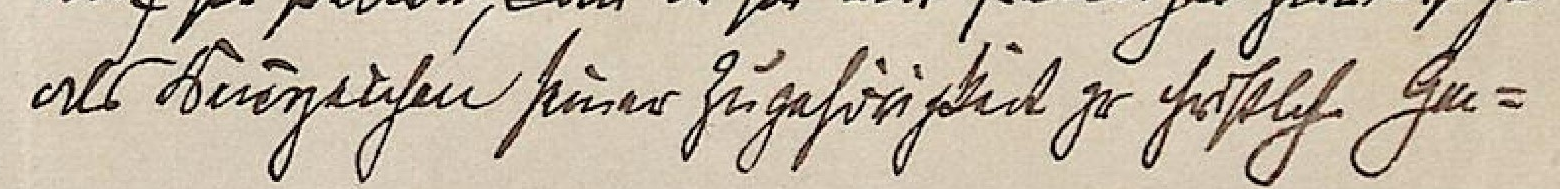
als Kenzeichen seiner Zugehörigkeit zr. christlch. Gm¬
